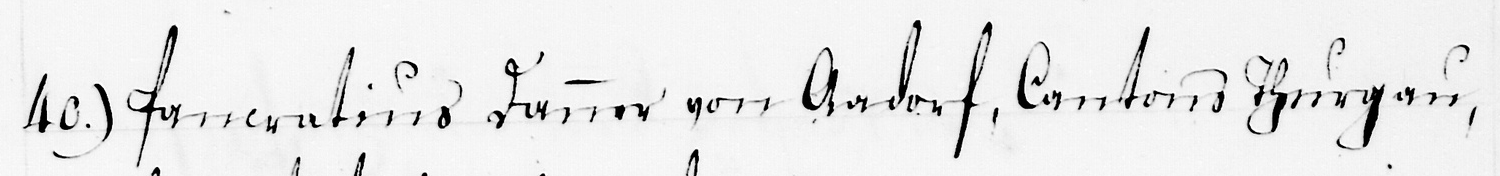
40.) Pancratius Danner von Aadorf, Cantons Thurgau,
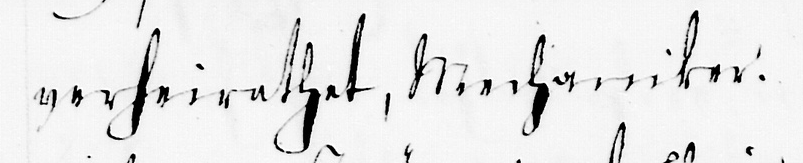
verheirathet, Mechaniker.
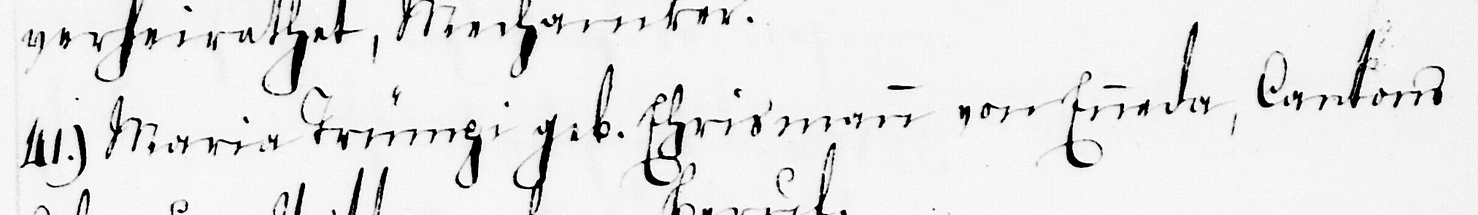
41.) Maria Trümpi geb. Ehrismann von Enneda, Cantons
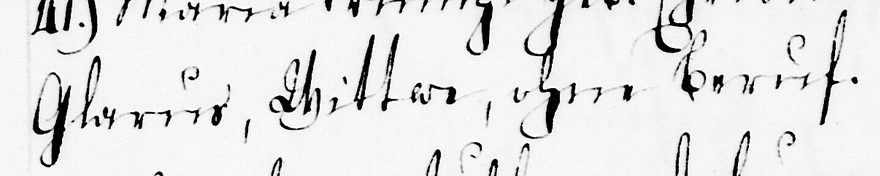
Glarus, Wittwe, ohne Beruf.
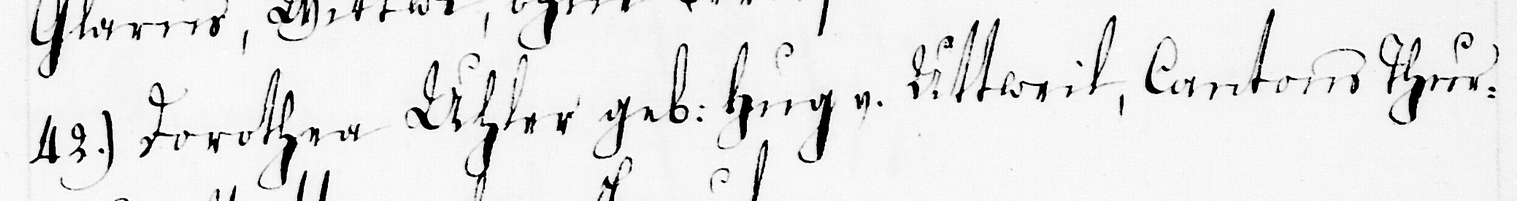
42.) Dorothea Uhler geb. Hug v. Uttweil, Cantons Thur¬
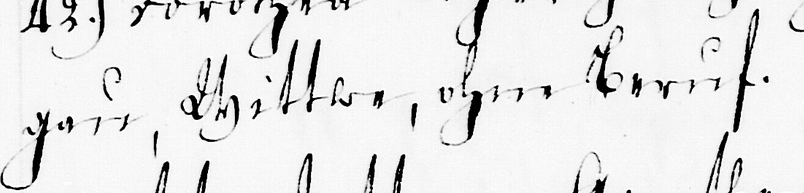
gau, Wittwe, ohne Beruf.
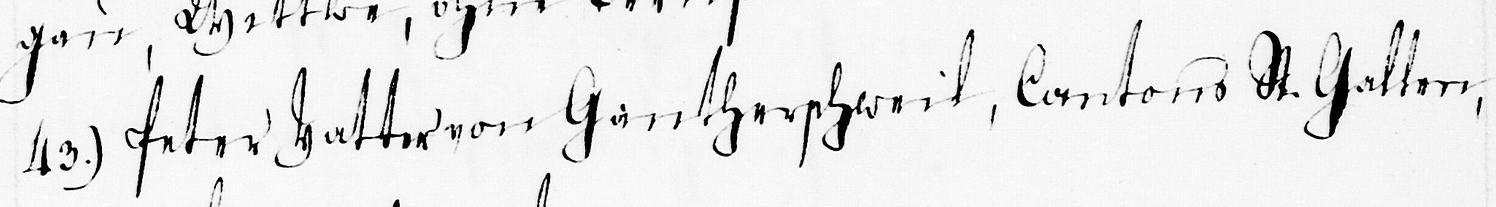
43.) Peter Vatter von Gantherschweil, Cantons St. Gallen,
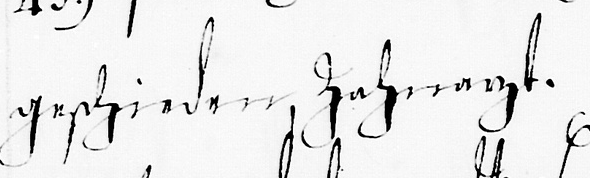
geschieden, Zahnarzt.
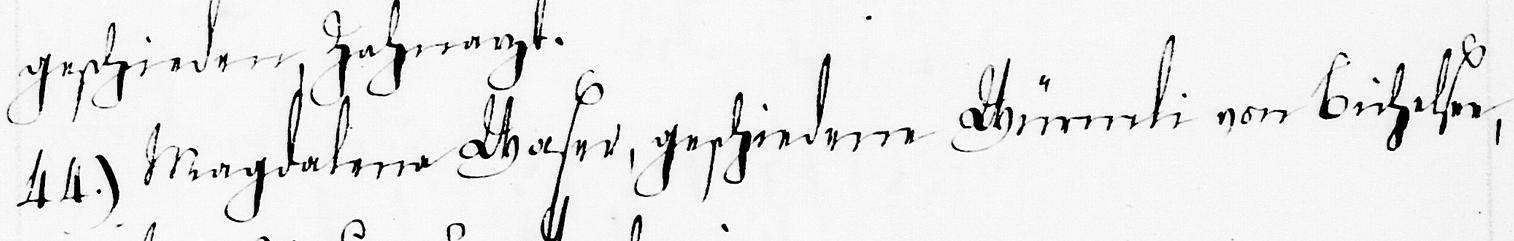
44.) Magdalena Waser, geschiedene Würmli von Bichelse¬
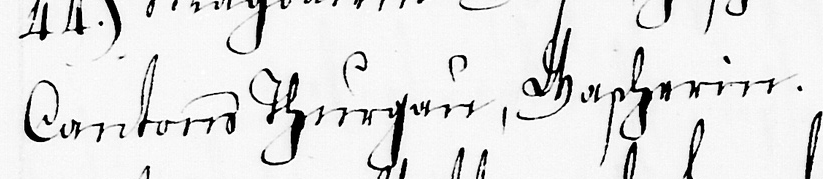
Cantons Thurgau, Wascherin.
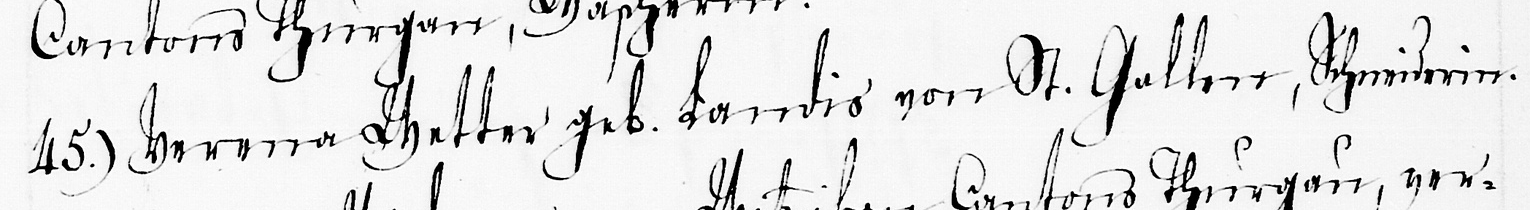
45.) Verena Wetter geb. Landis von St. Gallen, Schneiderin.
